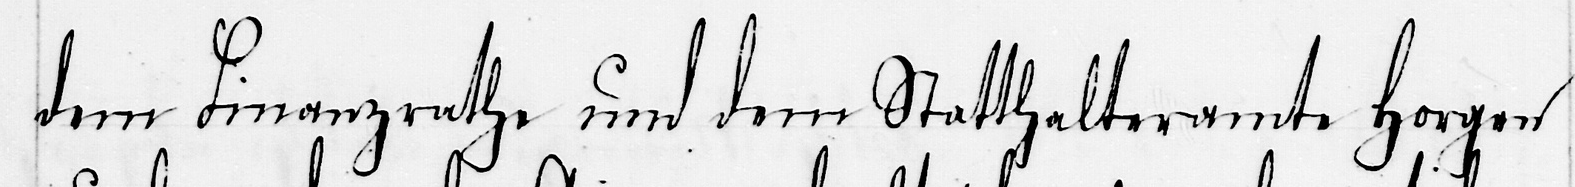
dem Finanzrathe und dem Statthalteramte Horgen
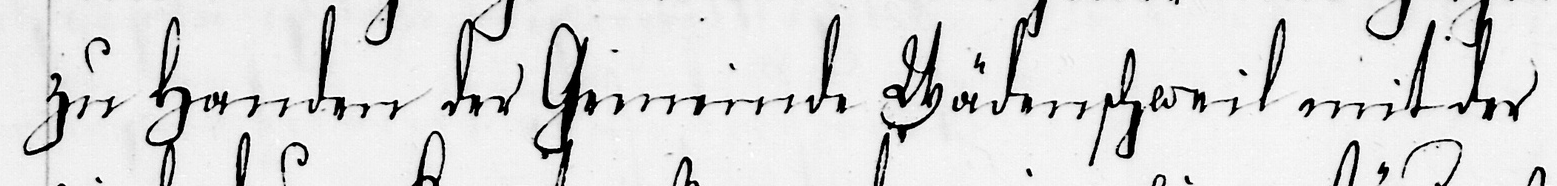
zu Handen der Gemeinde Wädenschweil mit der
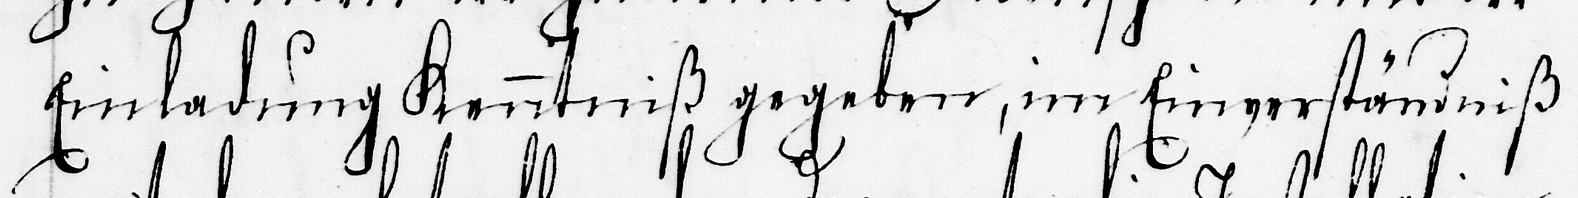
Einladung Kenntniß gegeben, im Einverständniß
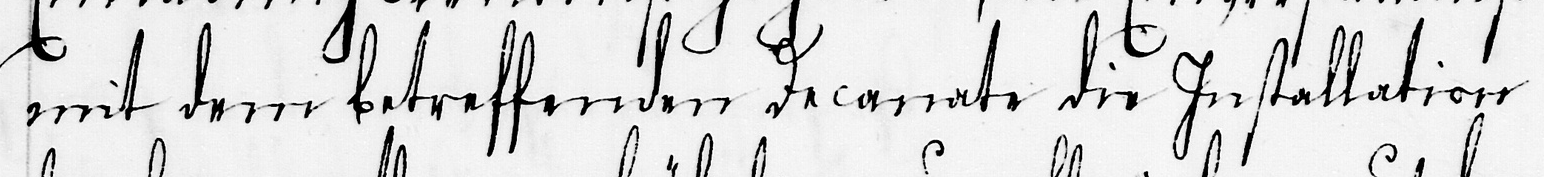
mit dem betreffenden Decanate die Installation
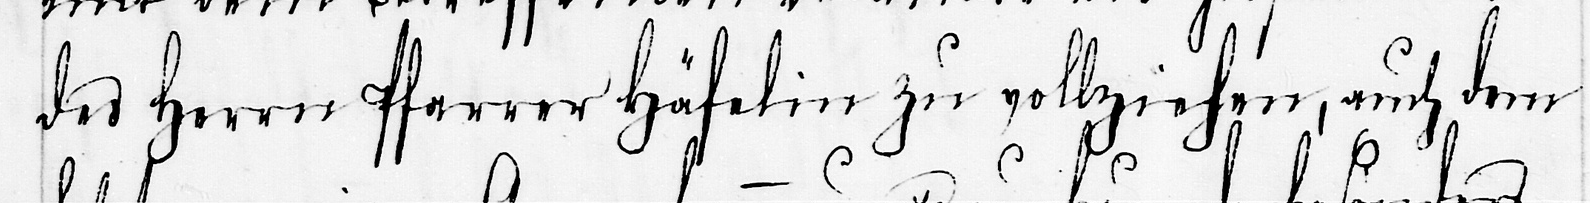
des Herrn Pfarrer Häfelin zu vollziehen, auch dem
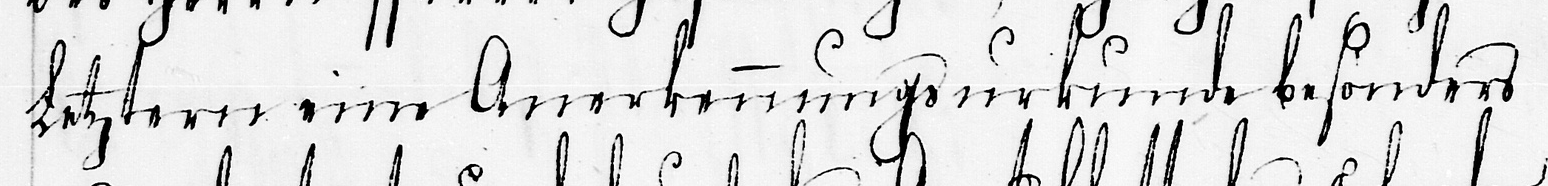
Letztern eine Anerkennungsurkunde besonders
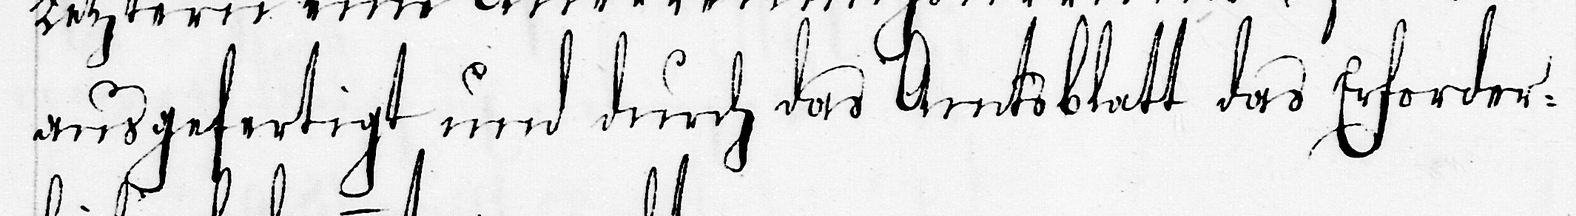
ausgefertigt und durch das Amtsblatt das Erforder¬
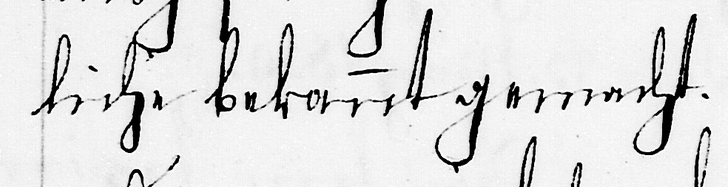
liche bekannt gemacht.
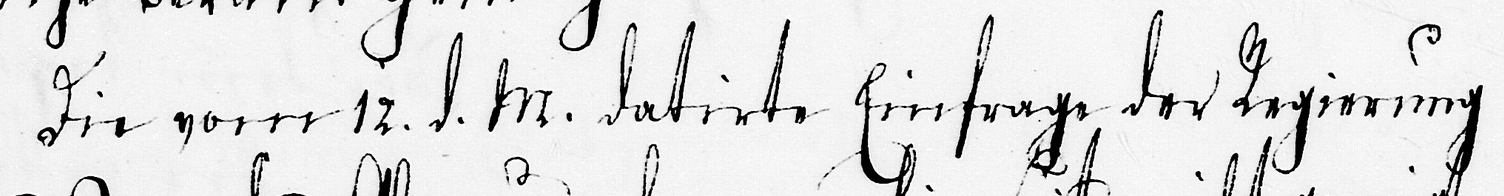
Die vom 12. d. M. datirte Einfrage der Regierung
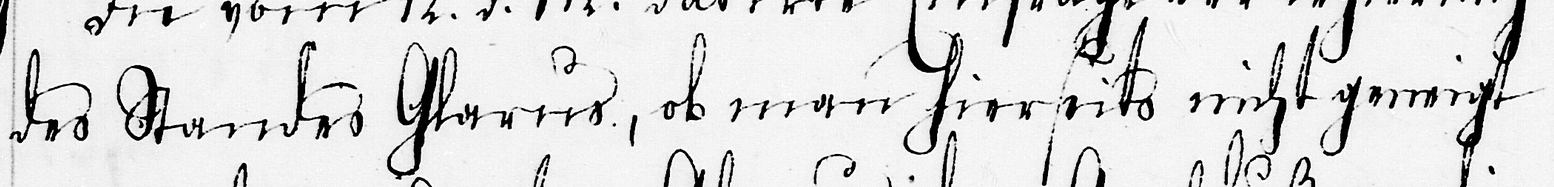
des Standes Glarus, ob man hierseits nicht geneigt
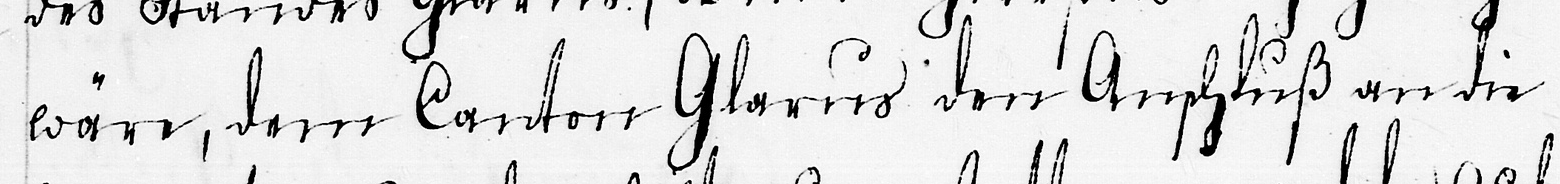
wäre, dem Canton Glarus den Anschluß an die
